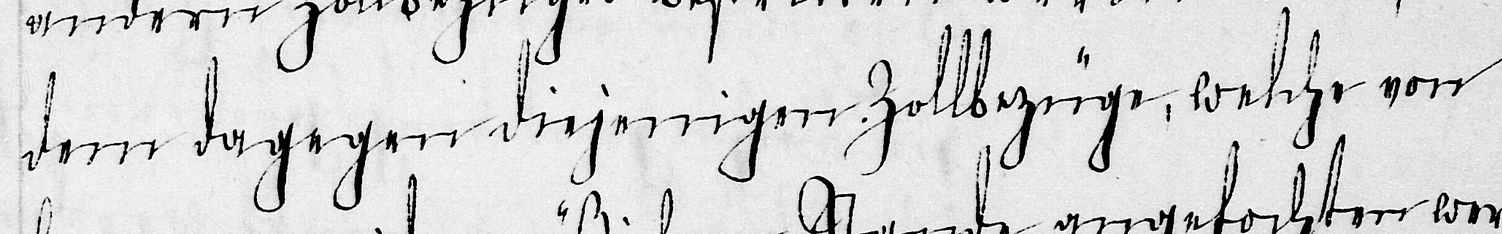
dem dagegen diejenigen Zollbezüge, welche von
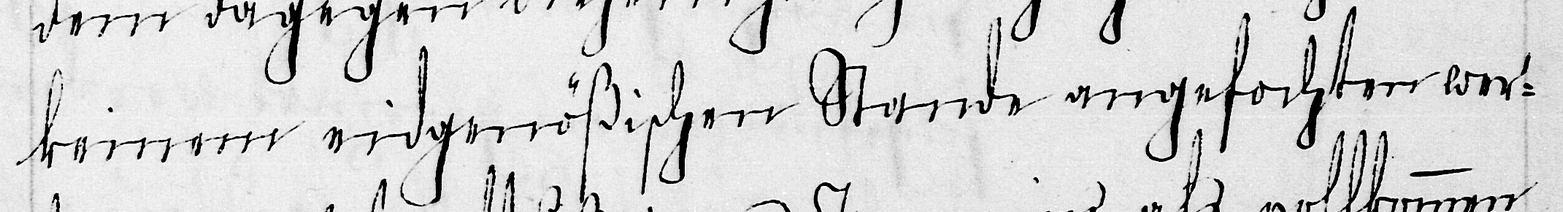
keinem eidgenößischen Stande angefochten wer¬
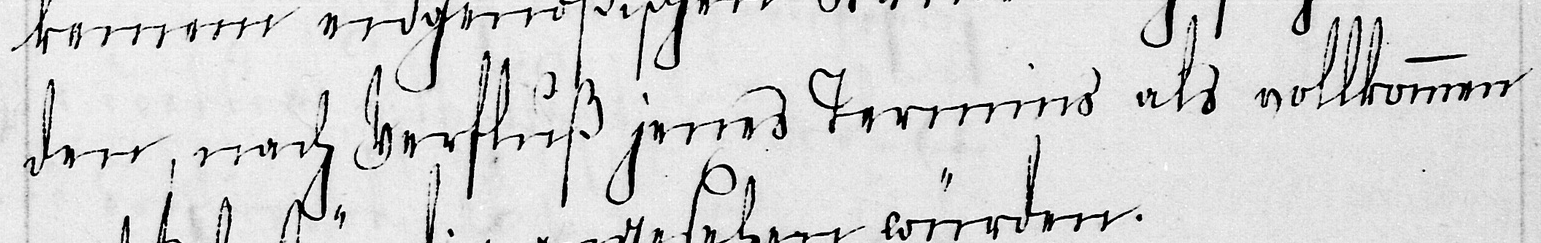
den, nach Verfluß jenes Termins als vollkommen
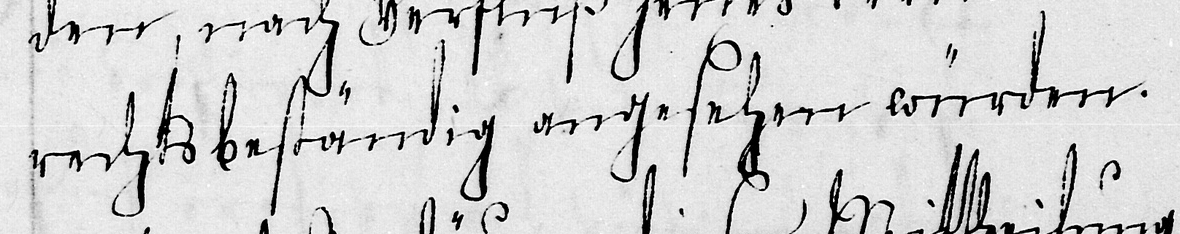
rechtsbeständig angesehen würden.
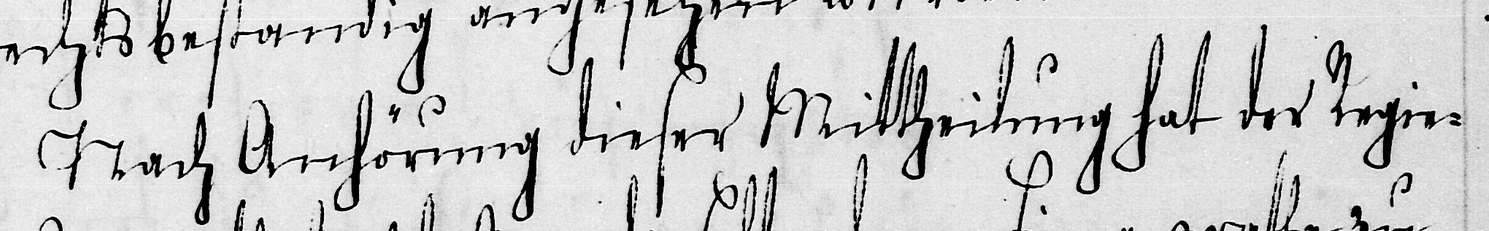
Nach Anhörung dieser Mittheilung hat der Regie¬
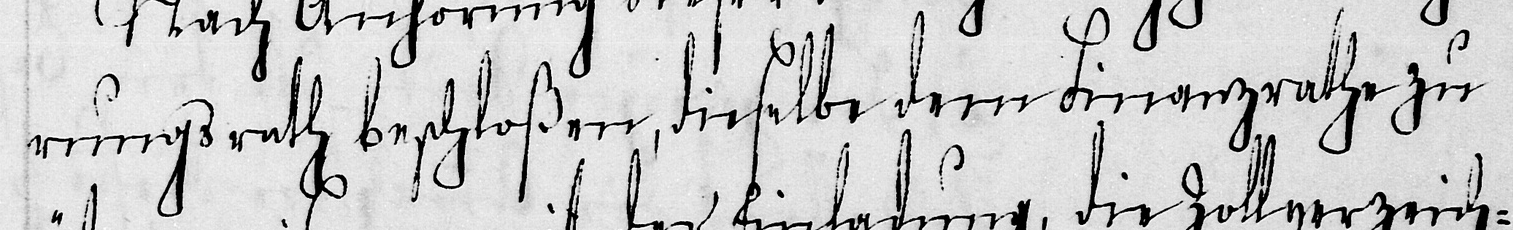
rungsrath beschloßen, dieselbe dem Finanzrathe zu
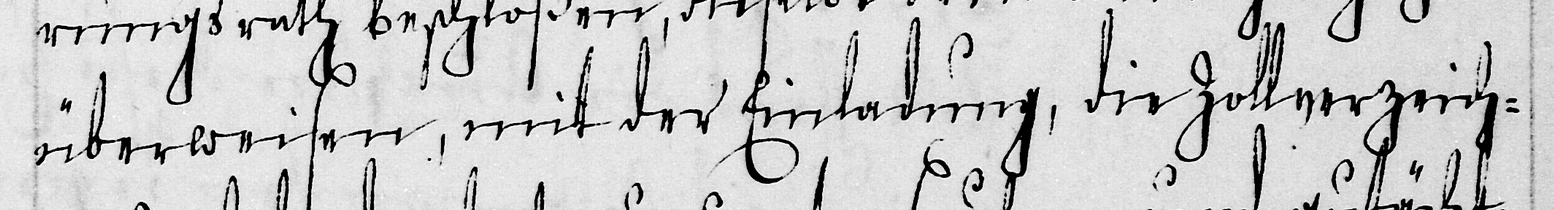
überweisen, mit der Einladung, die Zollverzeich¬
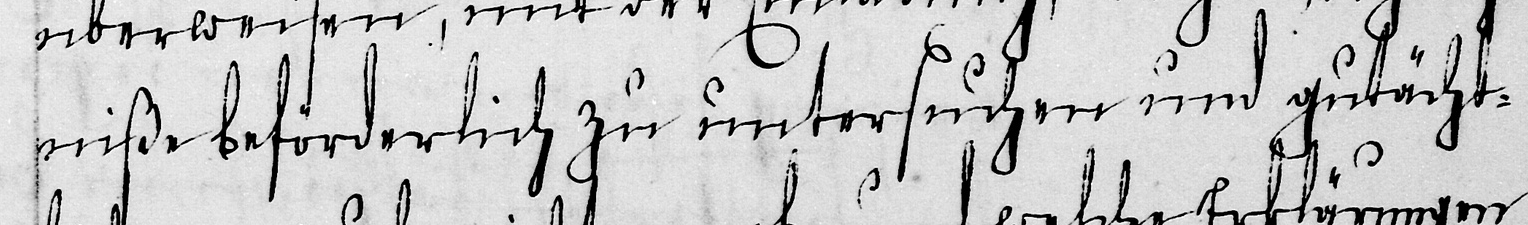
niße beförderlich zu untersuchen und gutächt¬
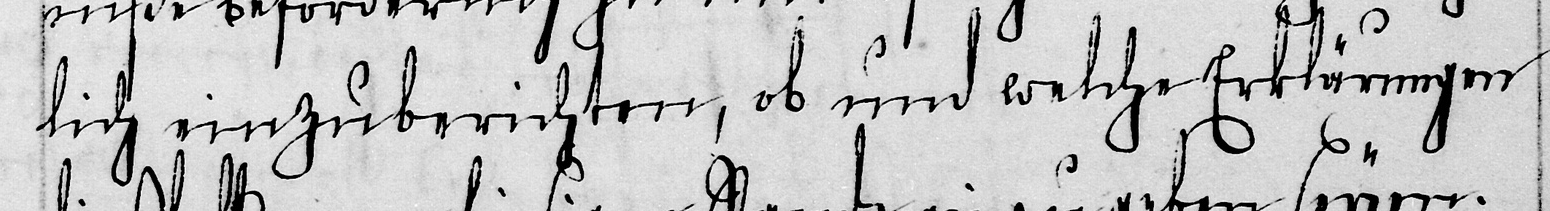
lich einzuberichten, ob und welche Erklärungen
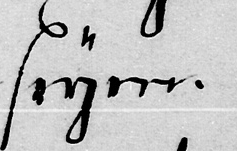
seyen.
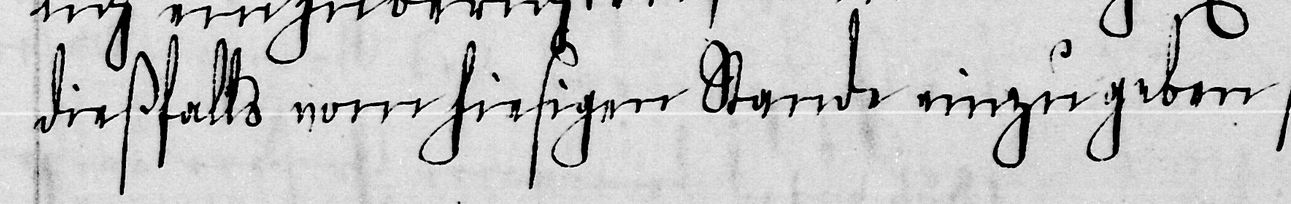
dießfalls vom hiesigen Stande einzugeben
